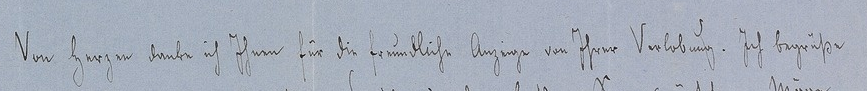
Von Herzen danke ich Ihnen für die freundliche Anzeige von Ihrer Verlobung. Ich begrüße
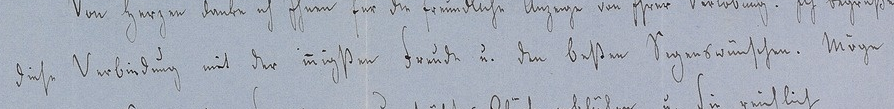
diese Verbindung mit der innigsten Freude u. den besten Segenswünschen. Möge
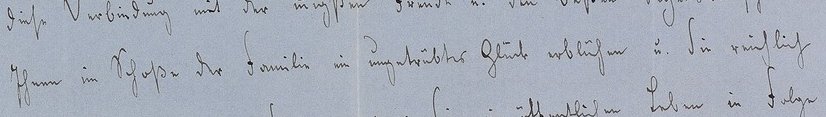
Ihnen im Schoße der Familie ein ungetrübtes Glück erblühen u. Sie reichlich
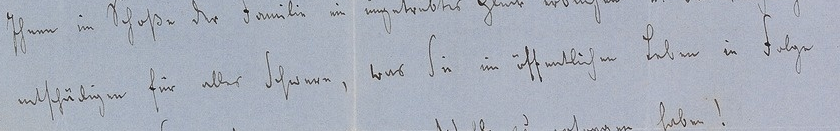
entschädigen für alles Schwere, was Sie im öffentlichen Leben in Folge
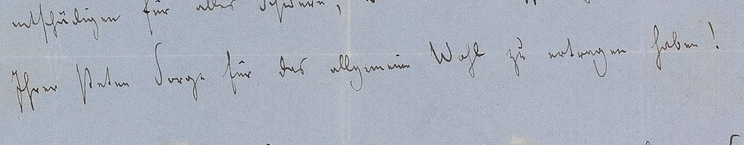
Ihrer steten Sorge für das allgemeine Wohl zu ertragen haben!
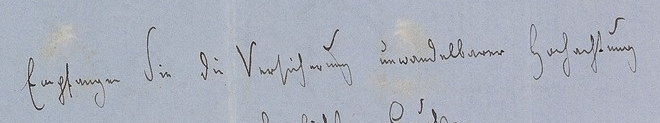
Empfangen Sie die Versicherung unwandelbarer Hochachtung
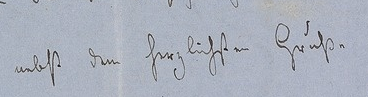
nebst dem herzlichsten Gruße
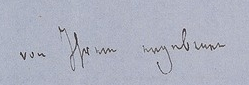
von Ihrem ergebenen
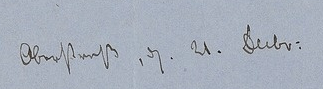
Oberstraß, d. 21. Decbr:
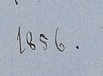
1856.
